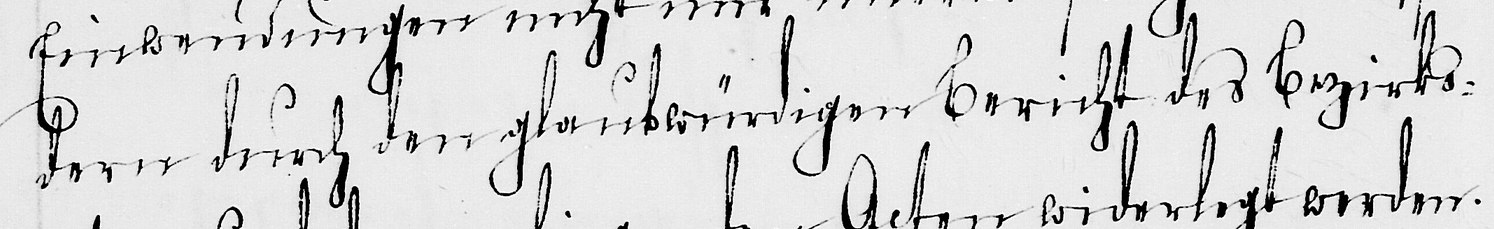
dern durch den glaubwürdigen Bericht des Bezirks¬
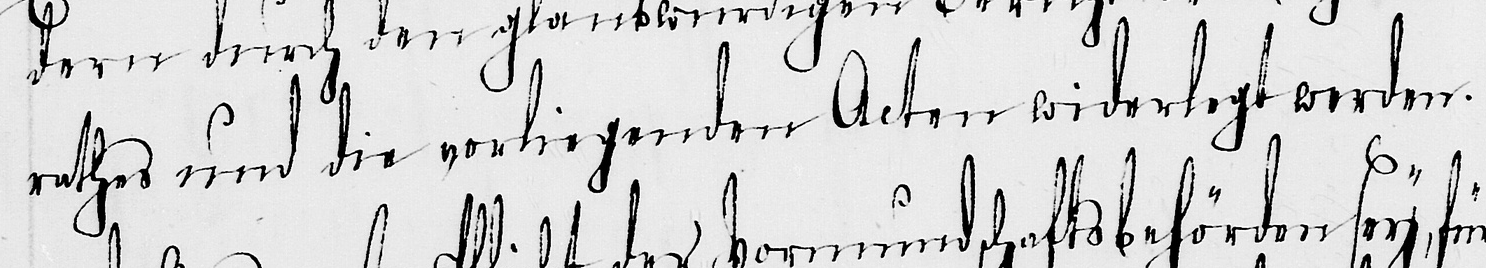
rathes und die vorliegenden Acten wiederlegt worden.
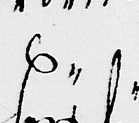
es¬
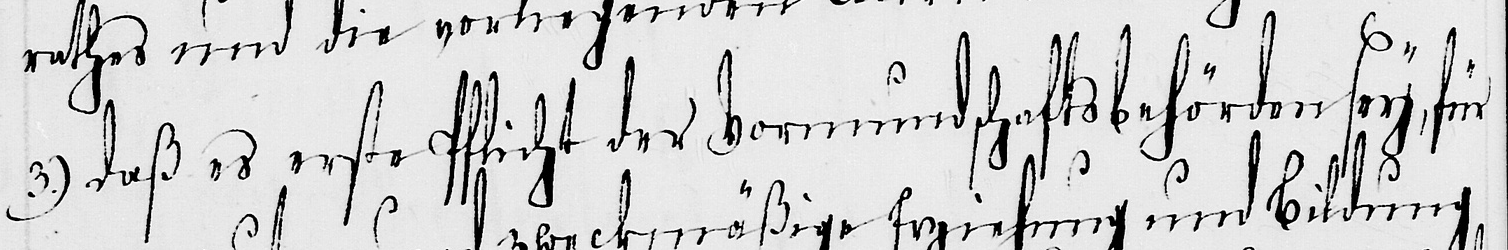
3.) Daß es erste Pflicht der Vormundschaftsbehörden sey, für
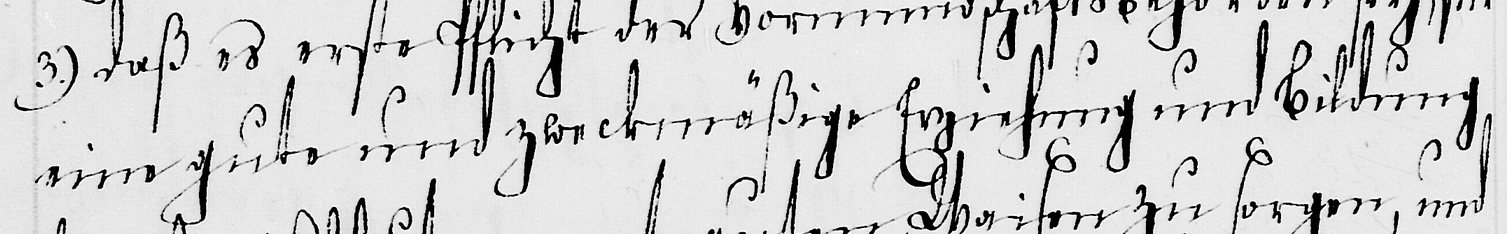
eine gute und zweckmäßige Erziehung und Bildung
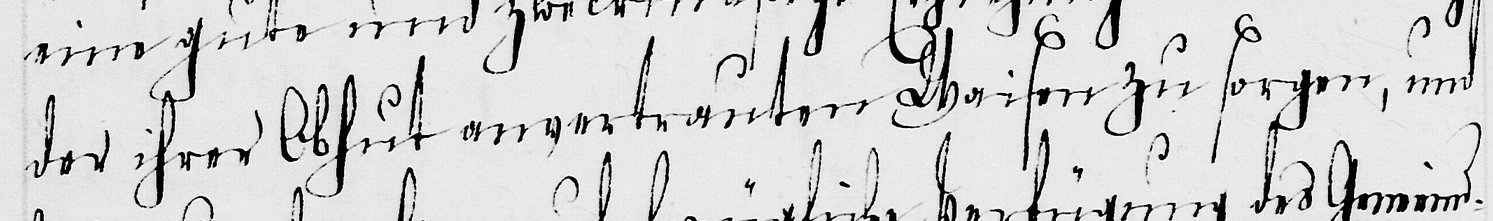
der ihrer Obhut anvertrauten Waisen zu sorgen, und
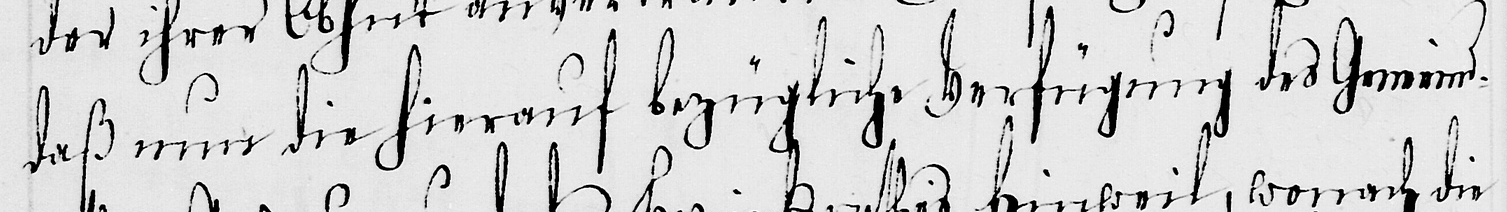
daß nun die hierauf bezügliche Verfügung des Gemeind¬
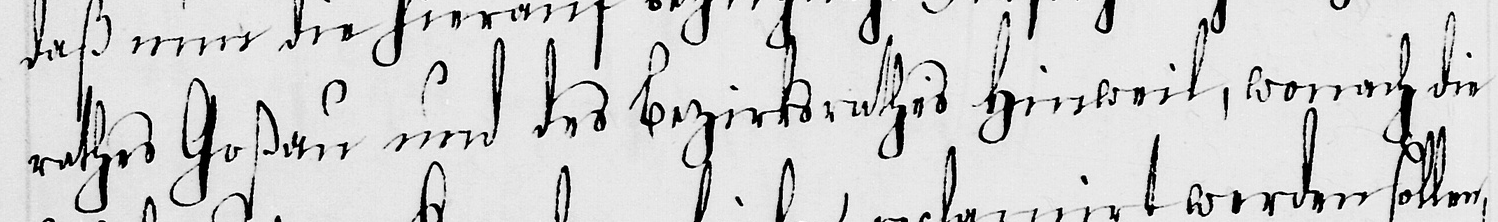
rathes Goßau und des Bezirksrathes Hinweil, wonach die
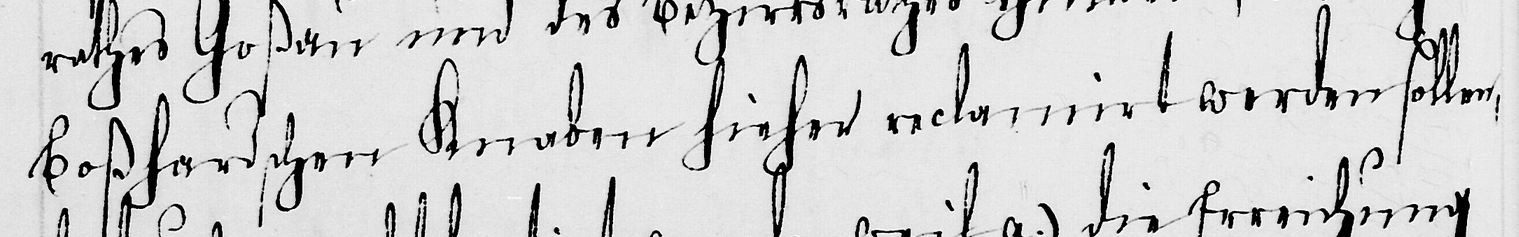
Boßhardschen Knaben hieher reclamirt werden solle¬
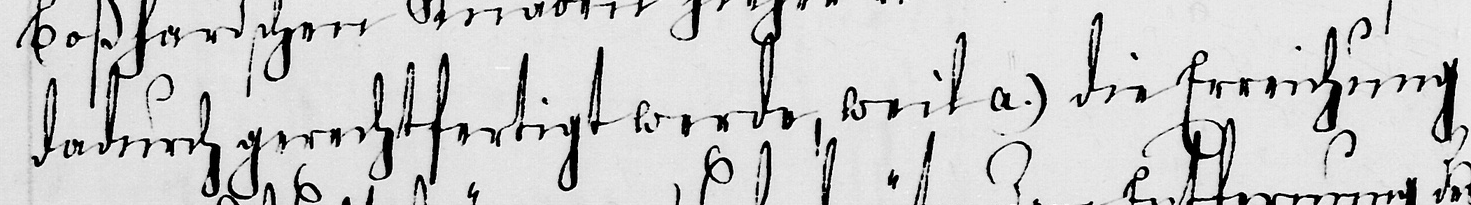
dadurch gerechtfertigt werde, weil a.) die Erreichung
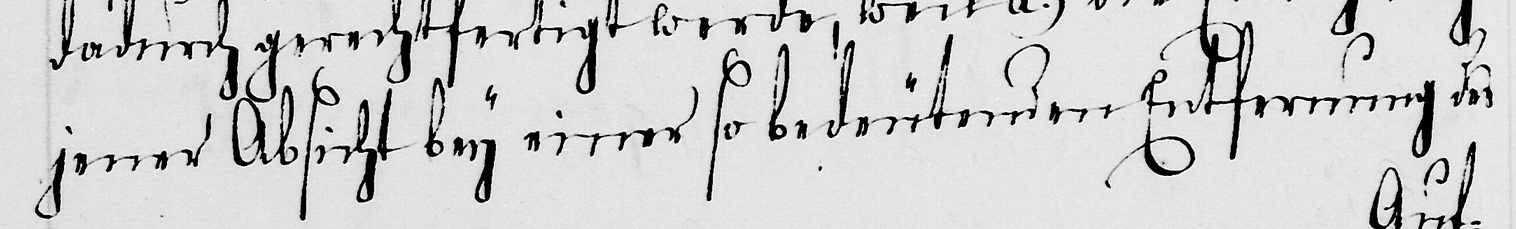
jener Absicht bey einer so bedeutenden Entfernung des
